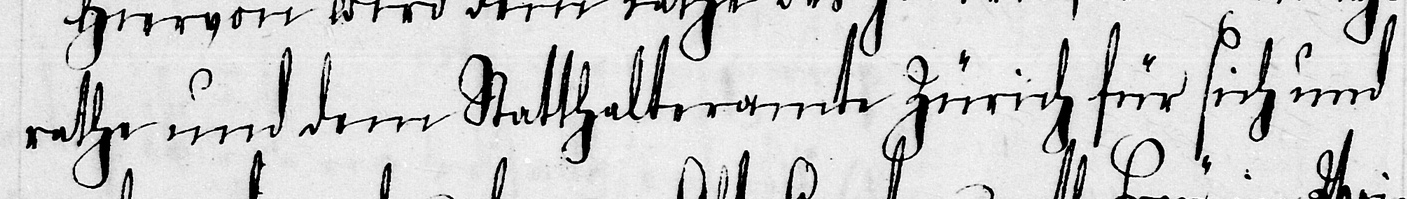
rathe und dem Statthalteramte Zürich für sich und
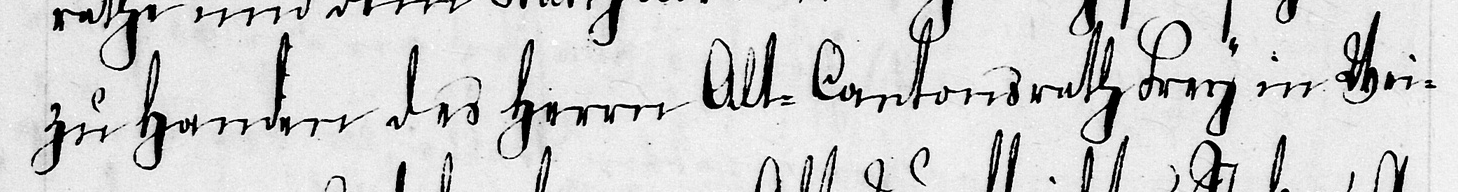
zu Handen des Herrn Alt-Cantonsrath Frey in Wei¬
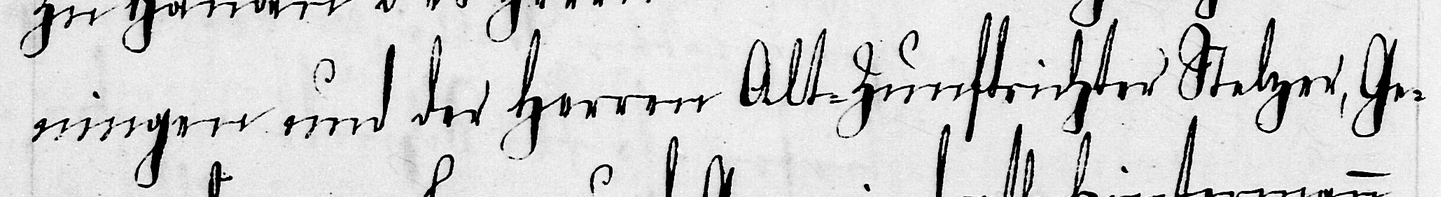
ningen und der Herren Alt-Zunftrichter Stelzer, Ge¬
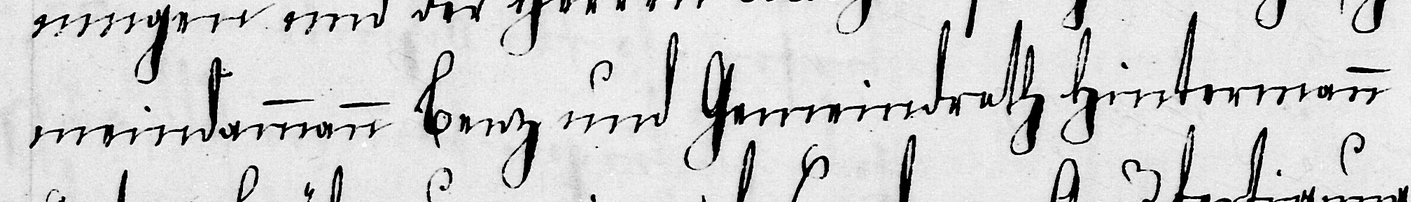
meindammann Benz und Gemeindrath Hintermann
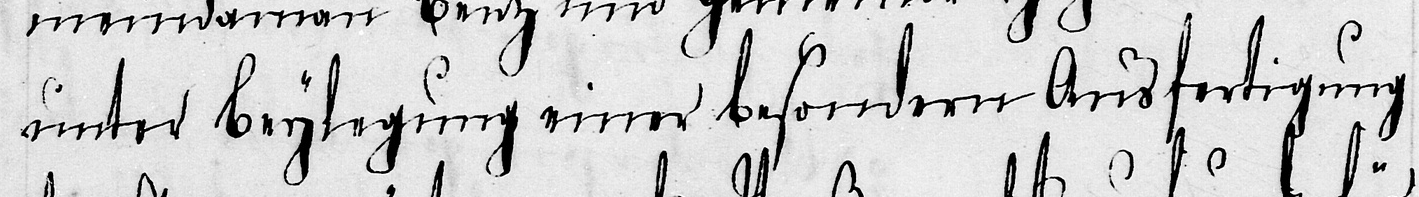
unter Beylegung einer besondern Ausfertigung
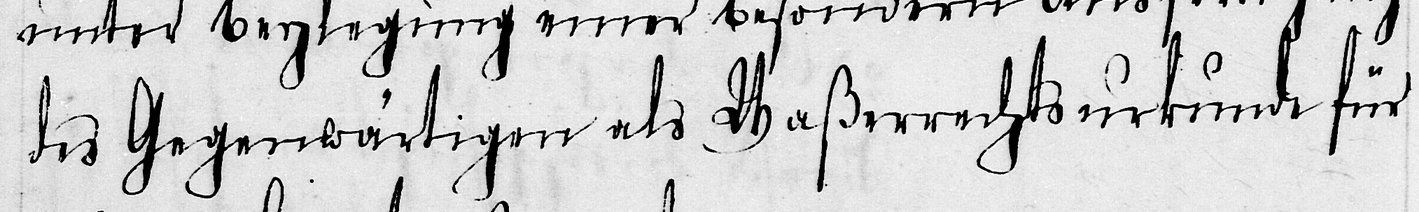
des Gegenwärtigen als Waßerrechtsurkunde für
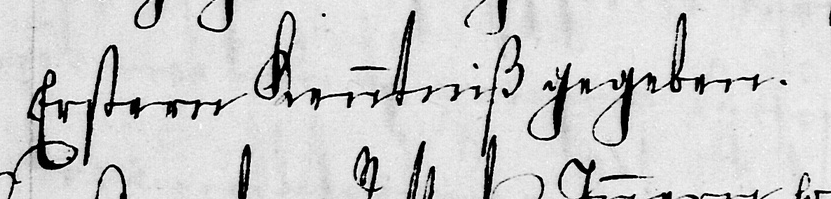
Erstern Kenntniß gegeben.
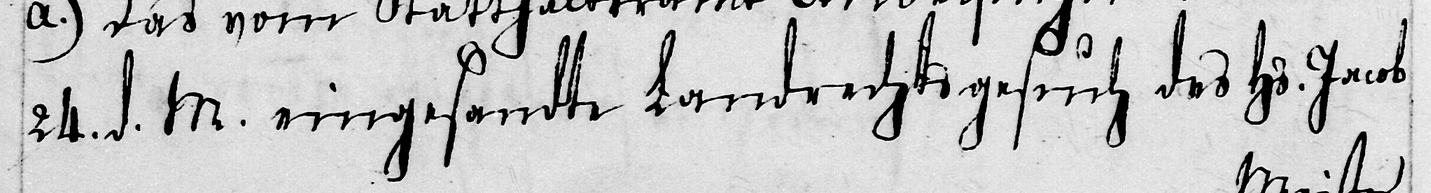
24. d. M. eingesandte Landrechtsgesuch des Hs. Jacob
